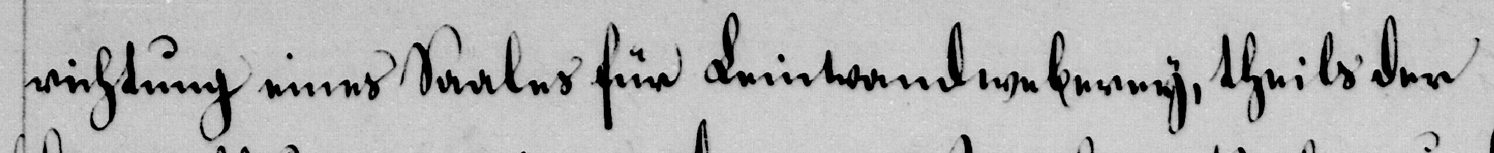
richtung eines Saales für Leinwandweberey, theils der
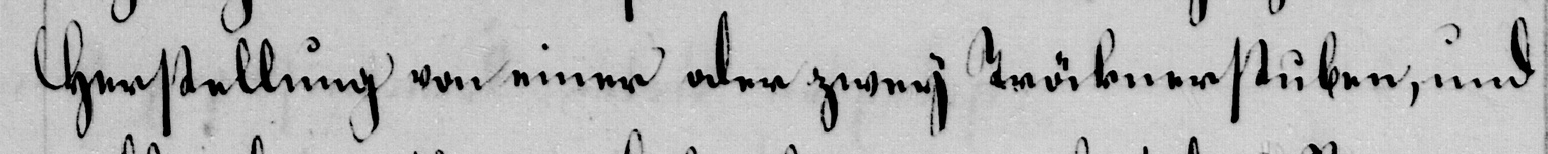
Herstellung von einer oder zwey Tröcknerstuben, und
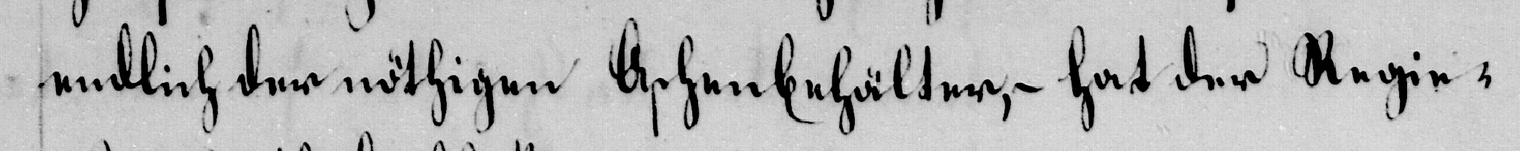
endlich der nöthigen Aschenbehälter, hat der Regie¬
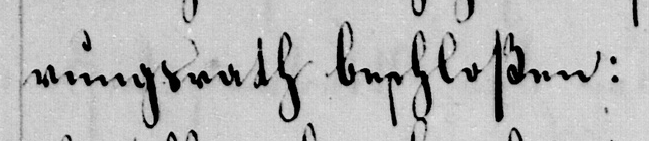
rungsrath beschloßen:
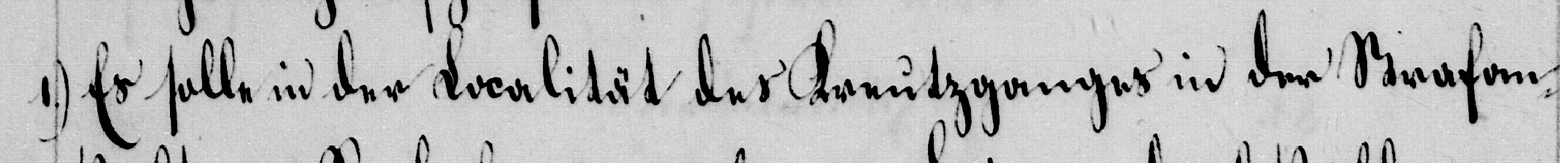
1.) Es solle in der Localität des Kreutzganges in der Strafan¬
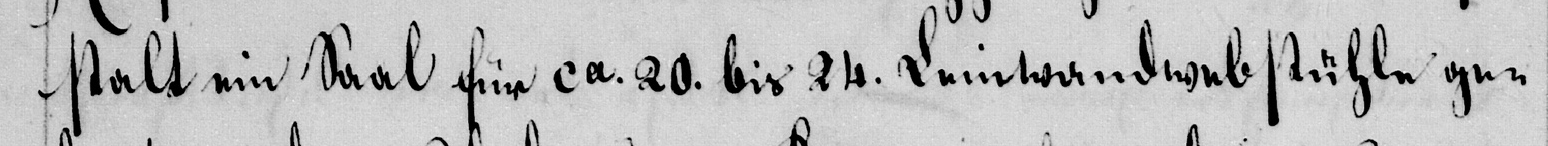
stalt ein Saal für ca. 20. bis 24. Leinwandwebstühle ge¬
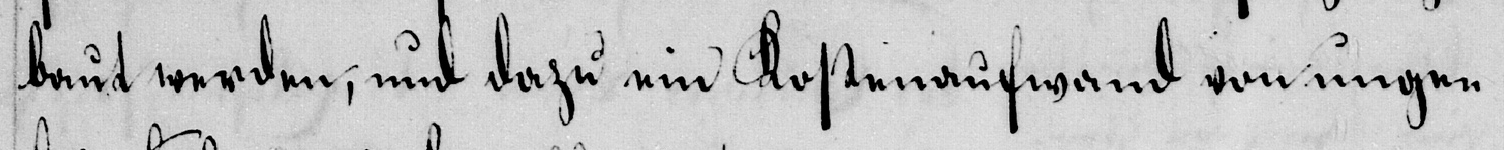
baut werden, und dazu ein Kostenaufwand von unge¬
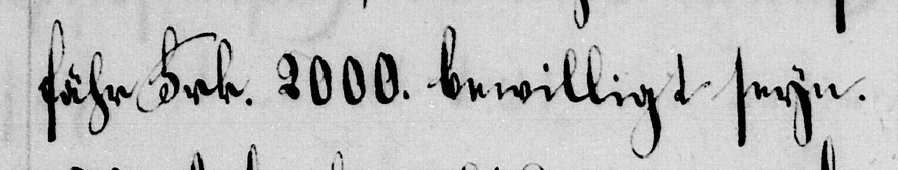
fähr Frk. 2000. bewilligt seyn.
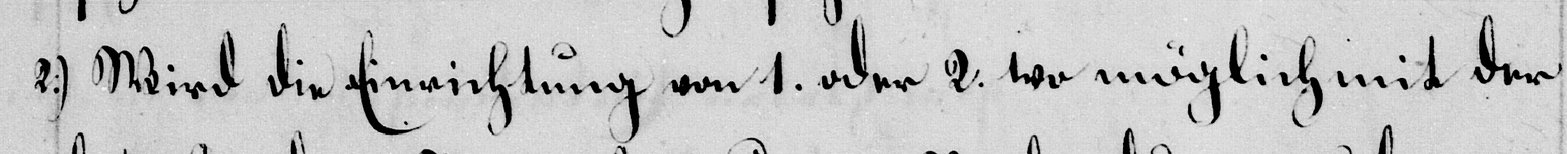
2.) Wird die Einrichtung von 1. oder 2. wo möglich mit der
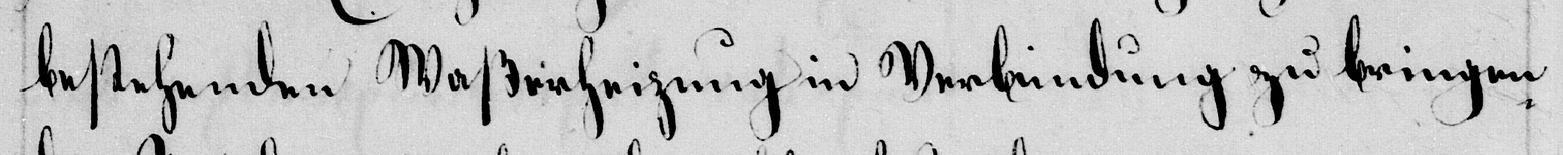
bestehenden Waßerheizung in Verbindung zu bringen¬
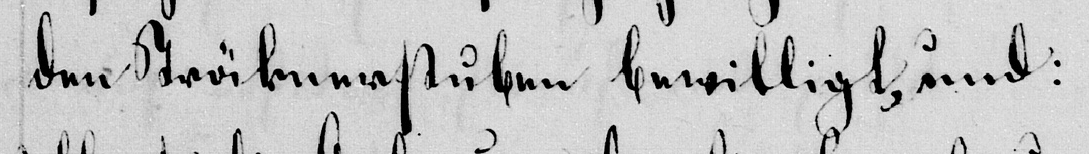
der Tröcknerstuben bewilligt, und:
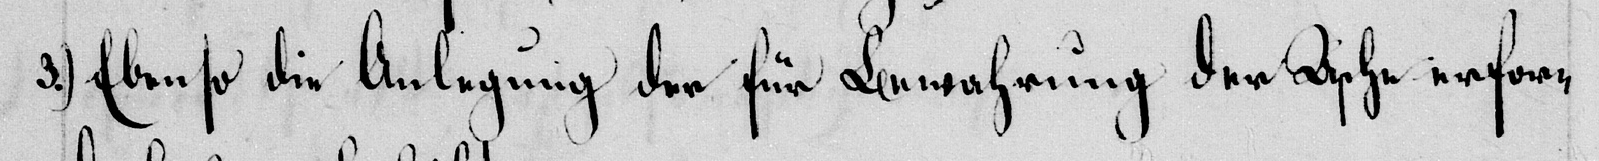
3.) Ebenso die Anlegung der für Bewahrung der Asche erfor¬
